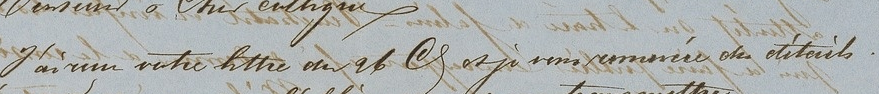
J'ai reçu votre lettre du 26 Ct et je vous remercie des détails
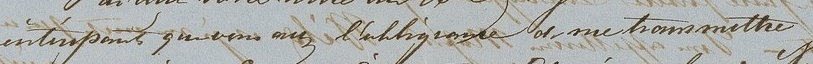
intéressants que vous aviez l'obligeance de me transmettre.
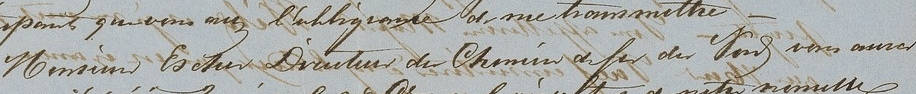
Monsieur Escher Directeur des Chemins de fer du Nord vous aura
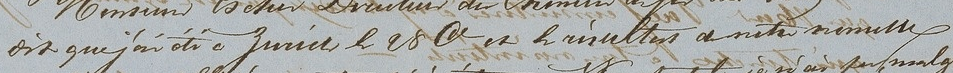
dit que j'ai été à Zurich l 28 Ct et le résultat de notre nouvelle
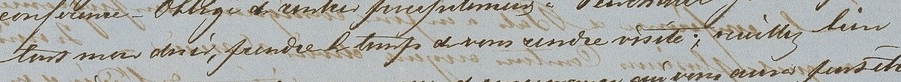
tout mon desir, prendre le temps de vous rendre visite; veuillez bien
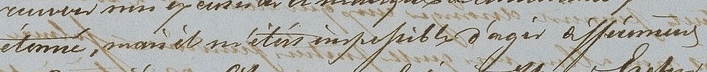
étonné, mais il m'était impossible d'agir différemment.
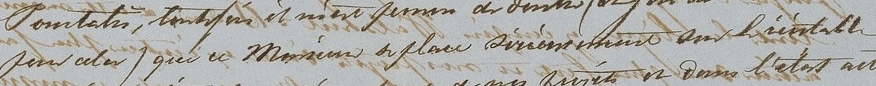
pour cela) que ce Monsieur se place sérieusement sur l instable
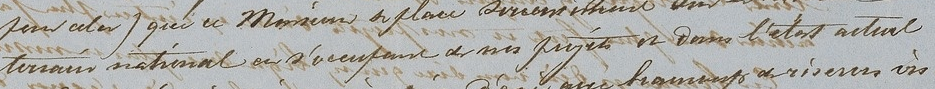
terrain national en s'occupant de nos projets et dans l'état actuel
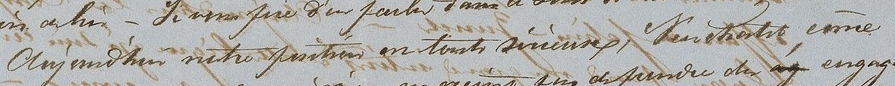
Aujourd'hui notre position est toute sériéuse, Neuchatel, comme
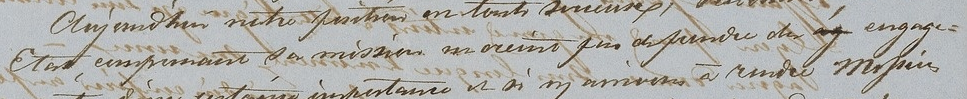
Etat, comprenant sa mission ne craint pas de prendre des ag engage-
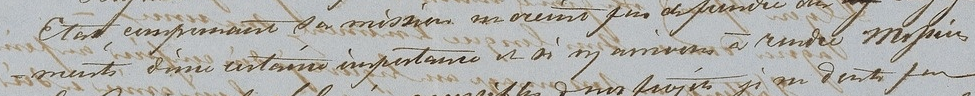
ments d'une certaine importance et si nous arrivons à rendre Messiers
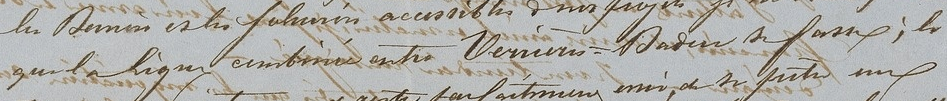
que la Ligne combinée entre Verrières–Baden se fasse; le
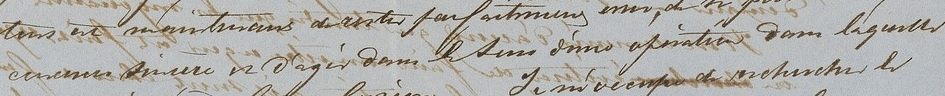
councours sincère et d'agir dans le sens d'une opération dans laquelle
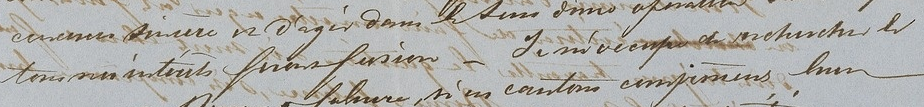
tous nos intérets feront fusion. Je m'occupe de rechercher le
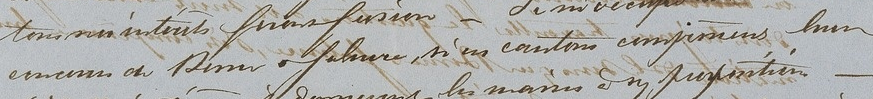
concours de Berne & Soleure, si ces cantons comprennent leurs
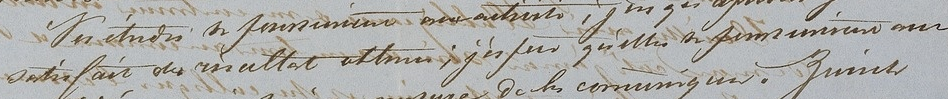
satisfait du résultat obtenu; j'éspère qu'elles se poursuivront avec
